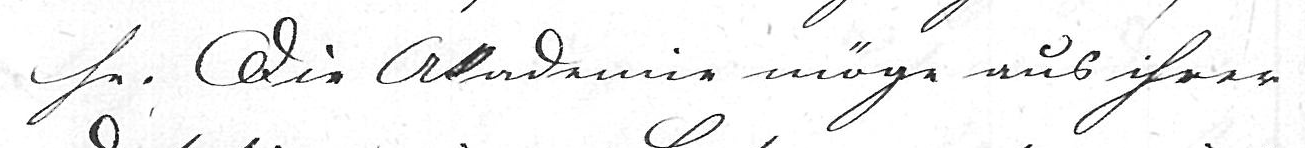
he. Die Akademie möge aus ihrer
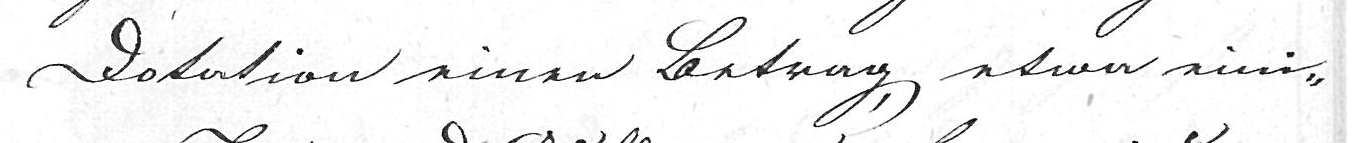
Dotation einen Betrag etwa eini-
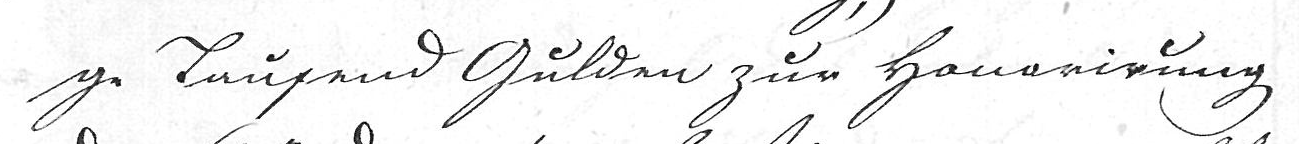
ge Tausend Gulden zur Honorirung
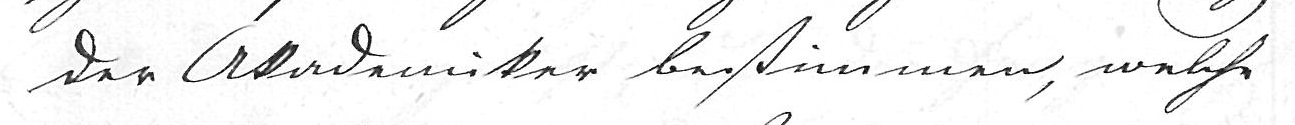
der Akademiker bestimmen, welche
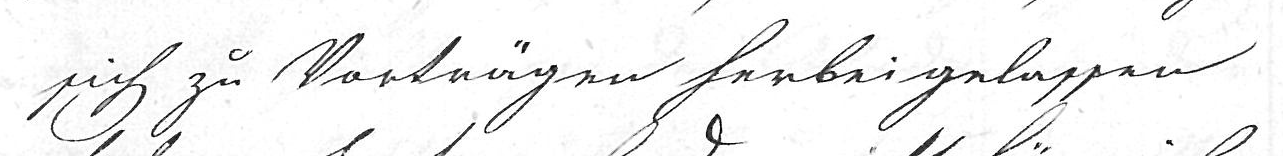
sich zu Vorträgen herbeigelassen
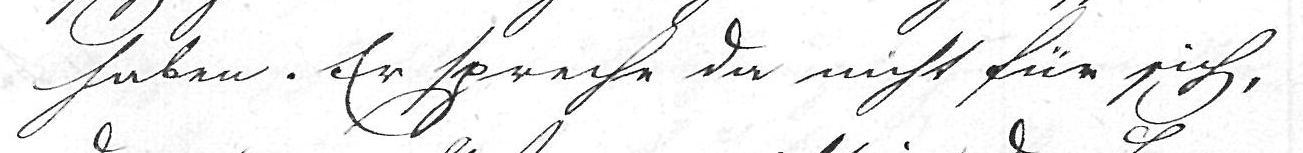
haben. Er spreche da nicht für sich,
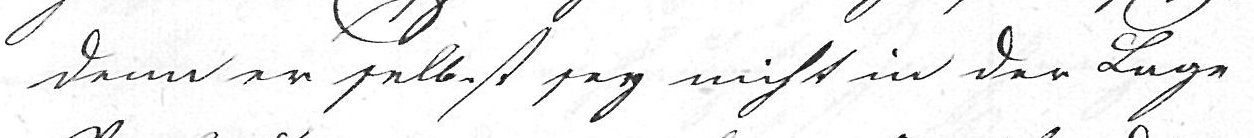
denn er selbst sey nicht in der Lage
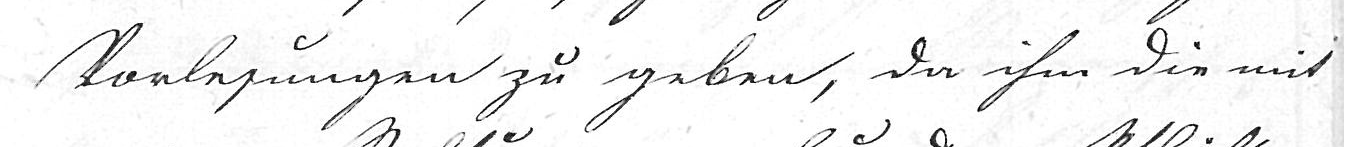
Vorlesungen zu geben, da ihm die mit
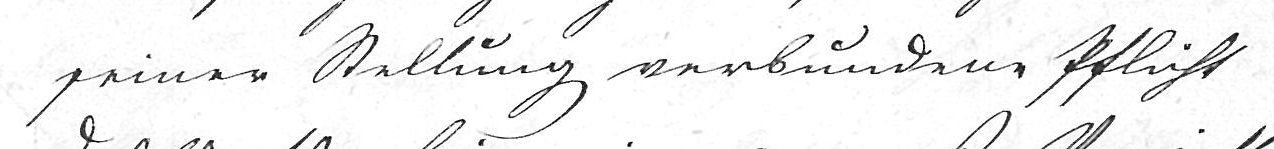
seiner Stellung verbundene Pflicht
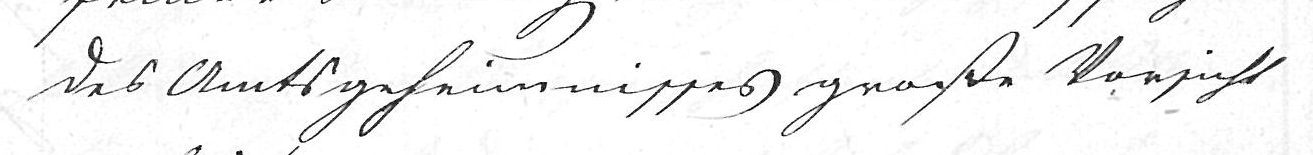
des Amtsgeheimisses große Vorsicht
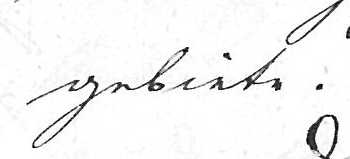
gebiete.
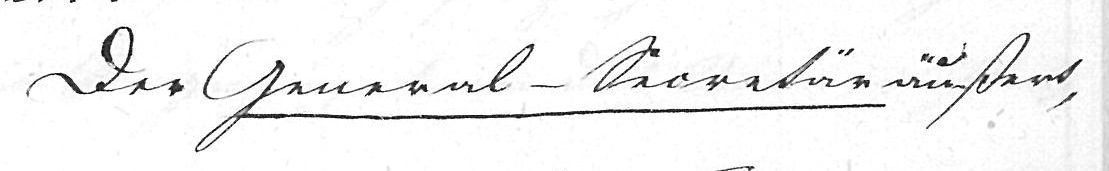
Der General-Secretär äußert,
